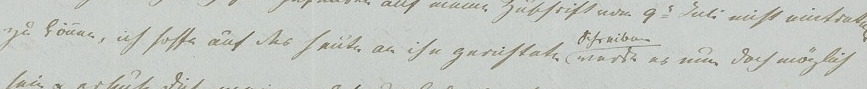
zu können, ich hoffe auf das heute an ihn gerichtete Schreiben werde es nun doch möglich
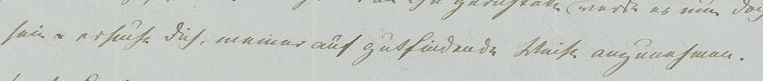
sein & ersuche Dich, meiner auf gutfindende Weise anzunehmen.
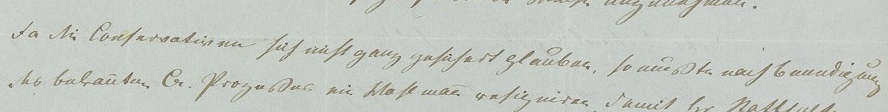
Da die Conservativen sich nicht ganz gesichert glauben, so mußte nach Beendigung
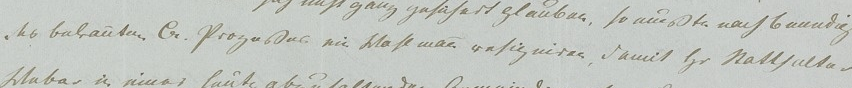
des bekannten Cr.Prozesses ein Wahlmann resigniren, damit Hr Statthalter
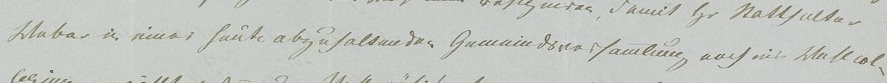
Weber in einer heute abzuhaltenden Gemeindeversammlung noch ins Wahlcol -
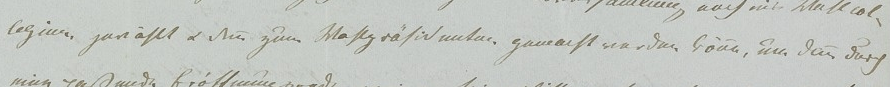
legium gewählt & dann zum Wahlpräsidenten gemacht werden könne, um dann durch
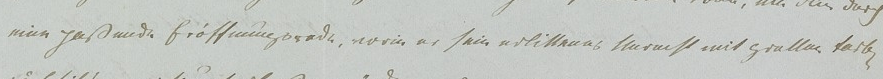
eine passende Eröffnungsrede, worin er sein erlittenes Unrecht mit grellen Farben
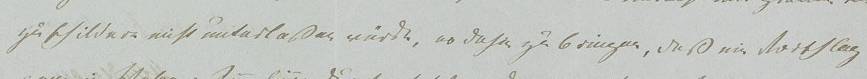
zu schildern nicht unterlassen würde, es dahin zu bringen, daß ein Vorschlag
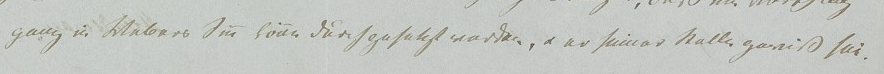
ganz in Webers Sinn könne durchgesetzt werden, & er seiner Stelle gewiß sei.
